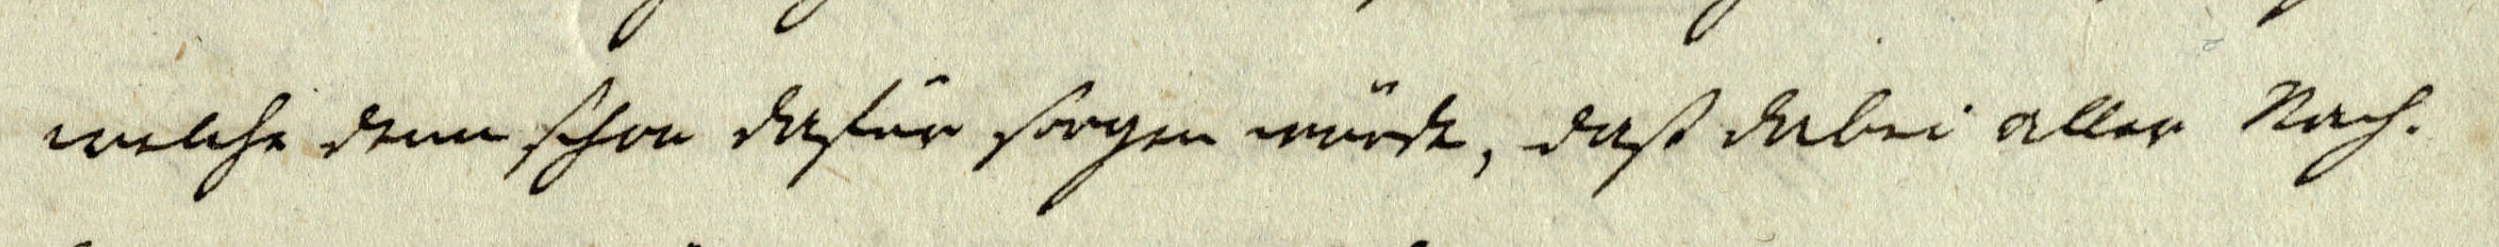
welche denn schon dafür sorgen würde, daß dabei aller Nach¬
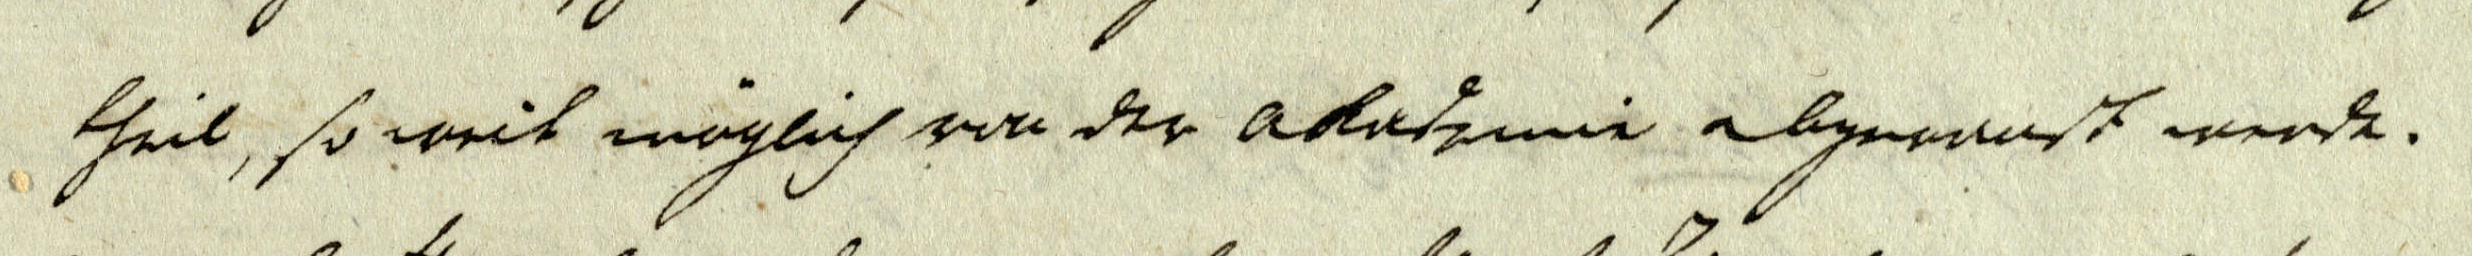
theil, so weit möglich von der Akademie abgewandt werde.
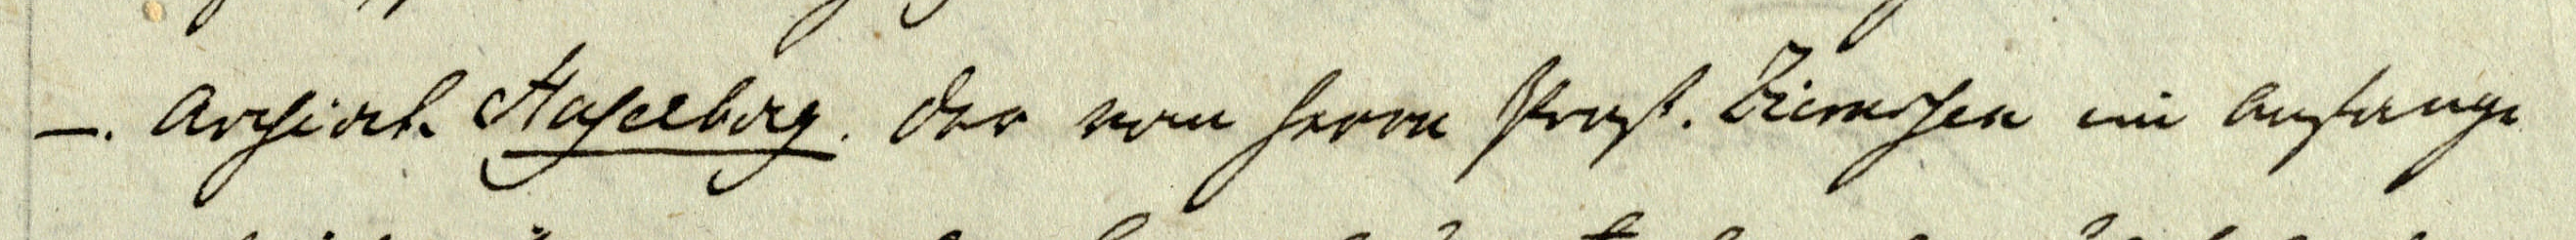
Archiat. Haselberg. der vom Herrn Prof. Ziemssen im Anfange
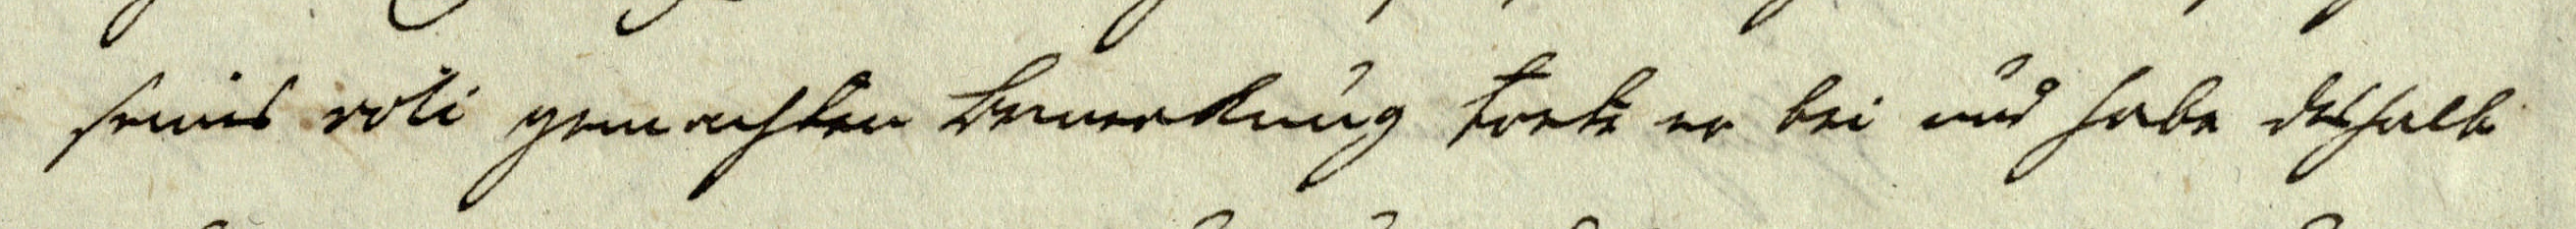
seines voti gemachten Bemerkung trete er bei und habe deshalb
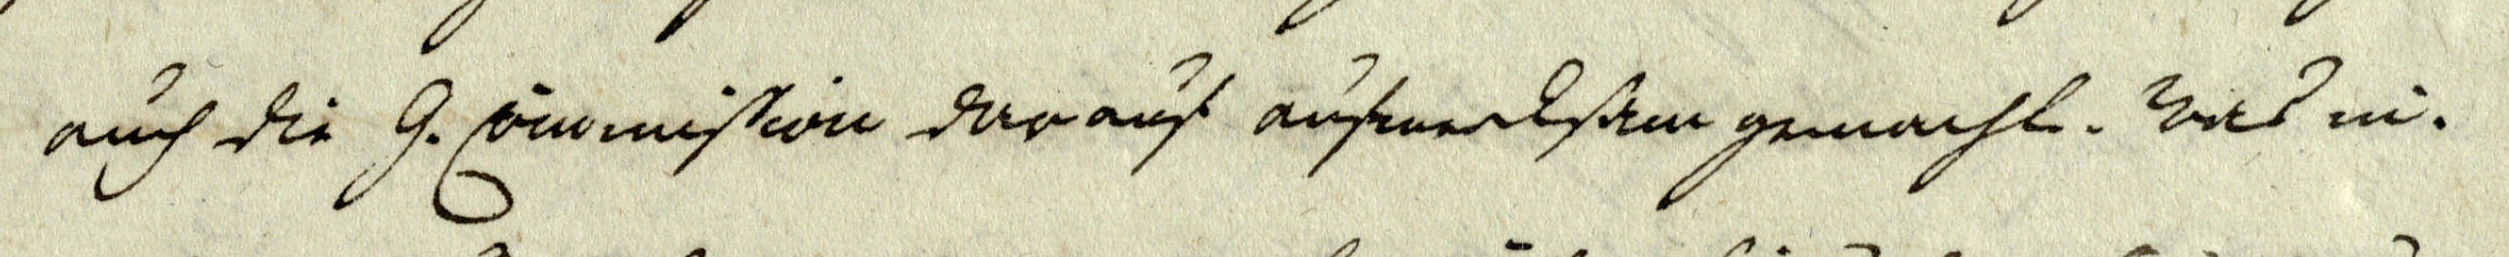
auch die G. Commission darauf aufmerksam gemacht. Was in¬
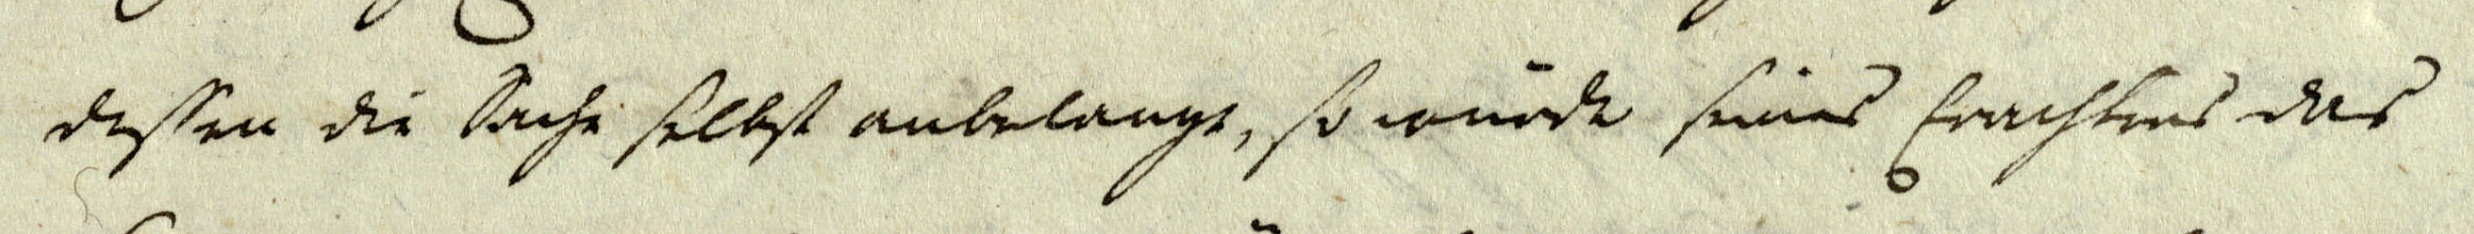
dessen die Sache selbst anbelange, so würde seines Erachtens das
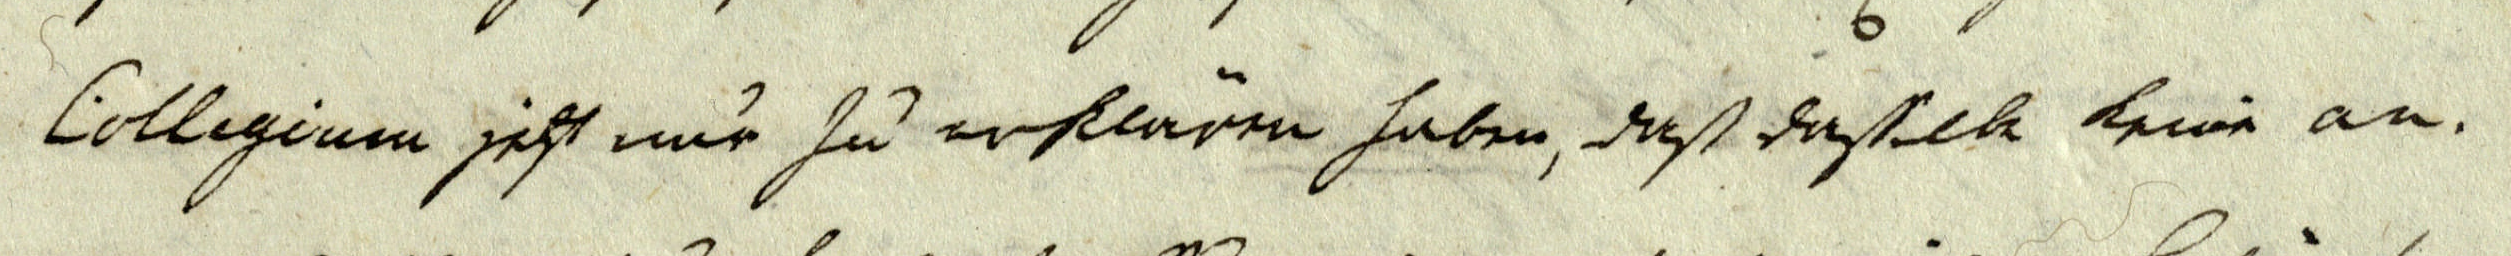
Collegium jetzt nur zu erklären haben, daß dasselbe keine an¬
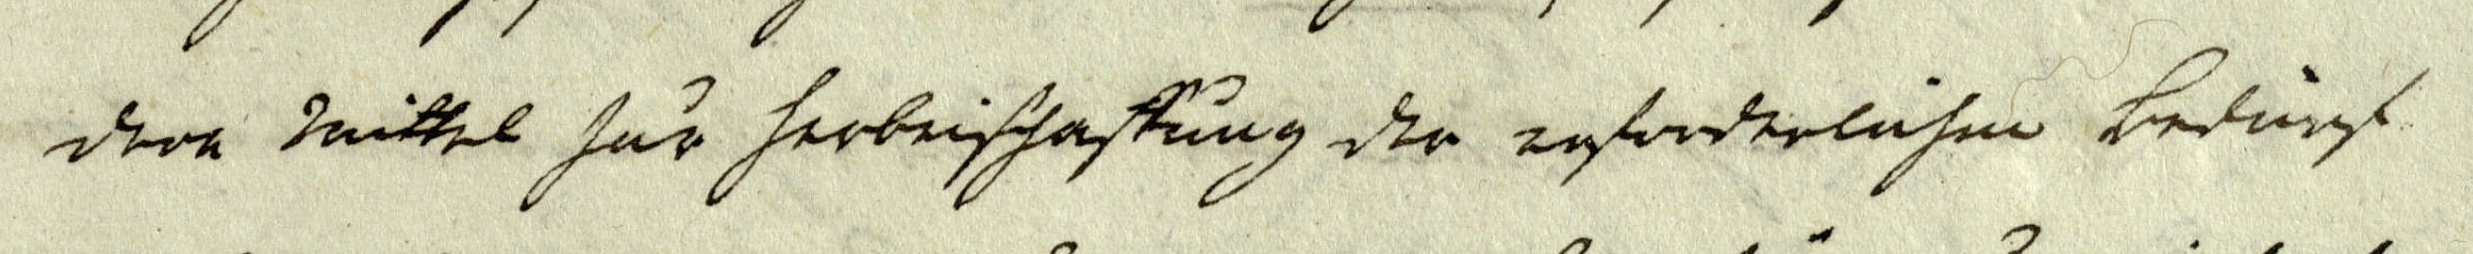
dere Mittel zur Herbeischaffung der erforderlichen Bedürf¬
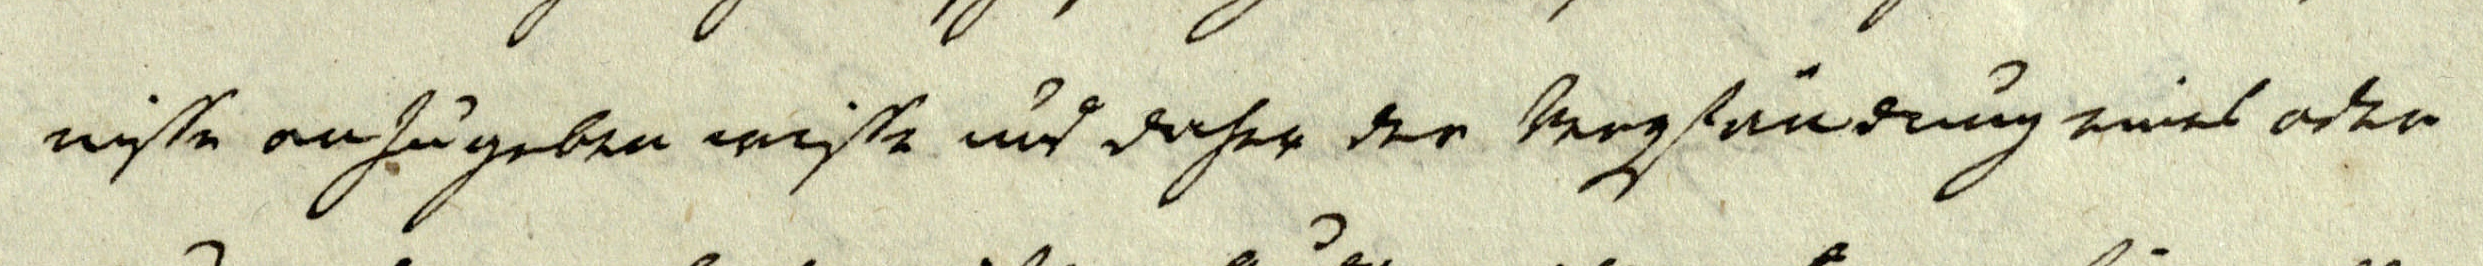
nisse anzugeben wisse und daher der Verpfändung eines oder
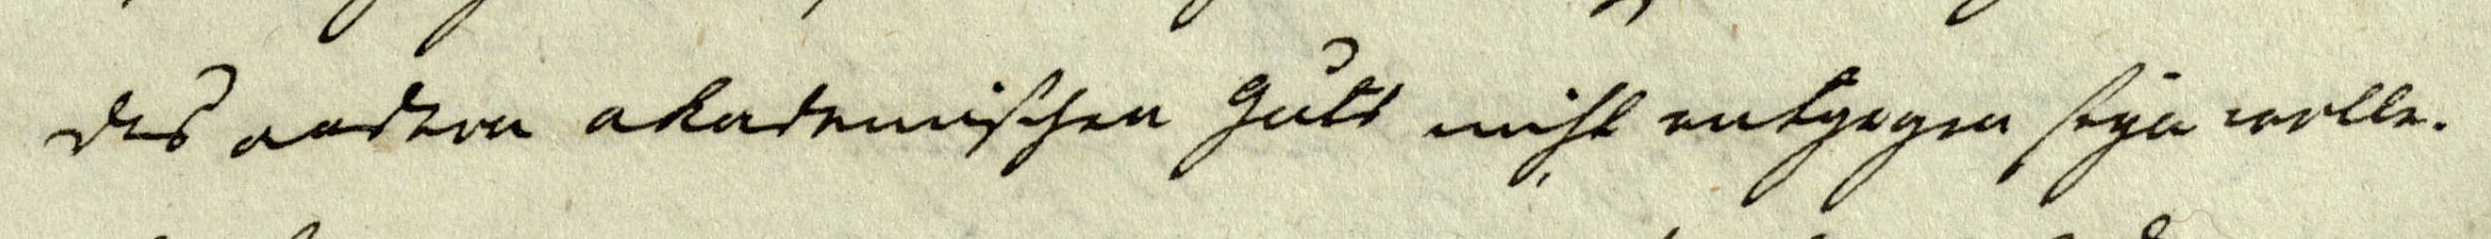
des andern akademischen Guts nicht entgegen seÿn wolle.
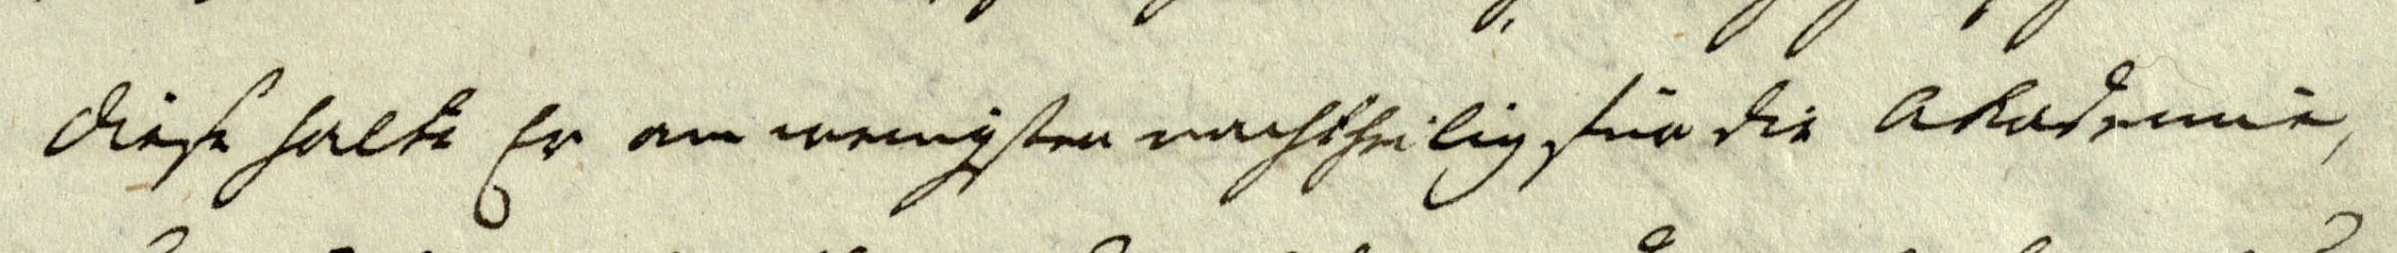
Diese halte Er am wenigsten nachtheilig für die Akademie,
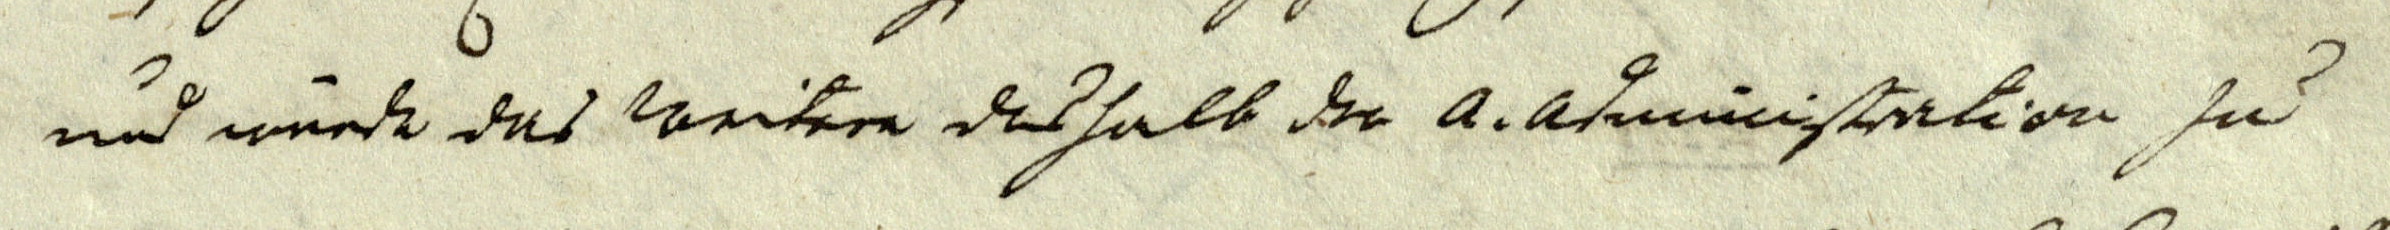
und würde das Weitere deshalb der A. Administration zu
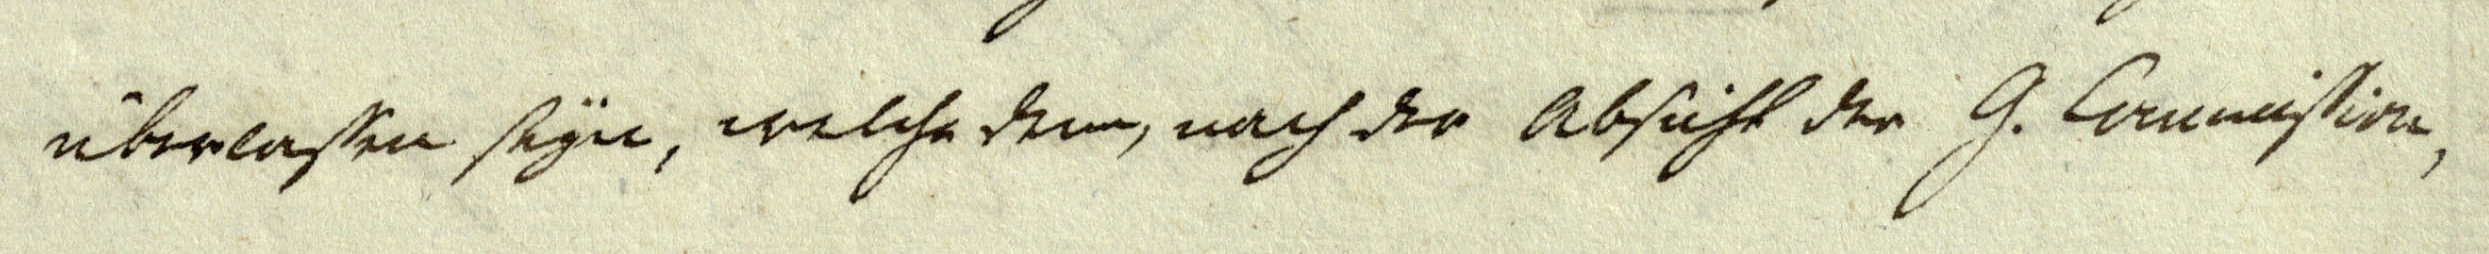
überlassen seÿn, welche denn, nach der Absicht der G. Commission,
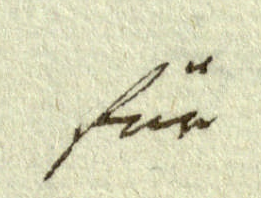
für
